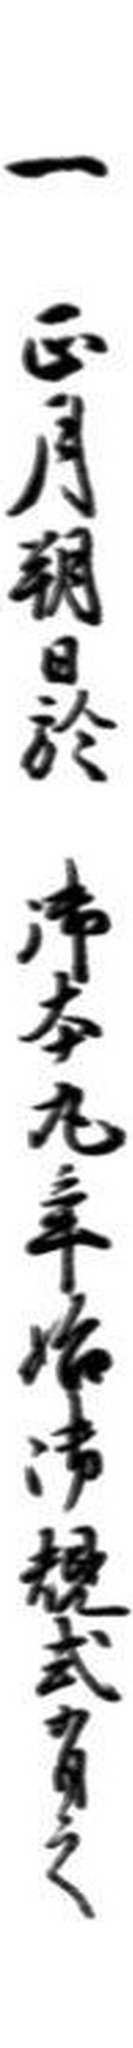一正月朔日於御本丸年始御規式有之
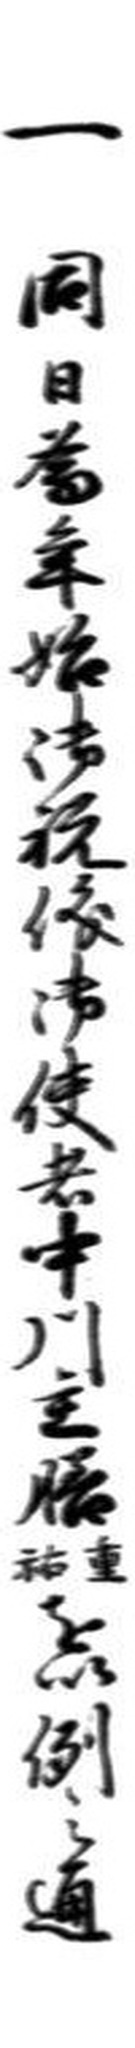一同日為年始御祝儀御使者中川主膳重祐を以例之通
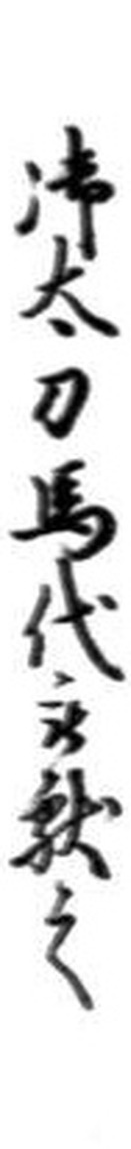御太刀馬代被献之
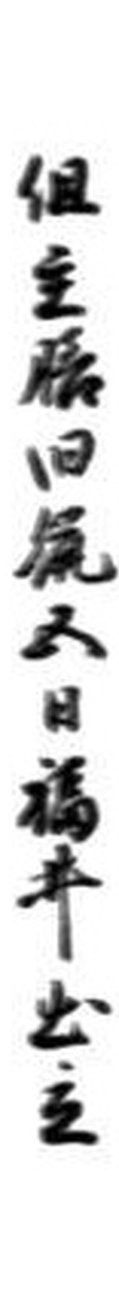但主膳旧臘五日福井出立
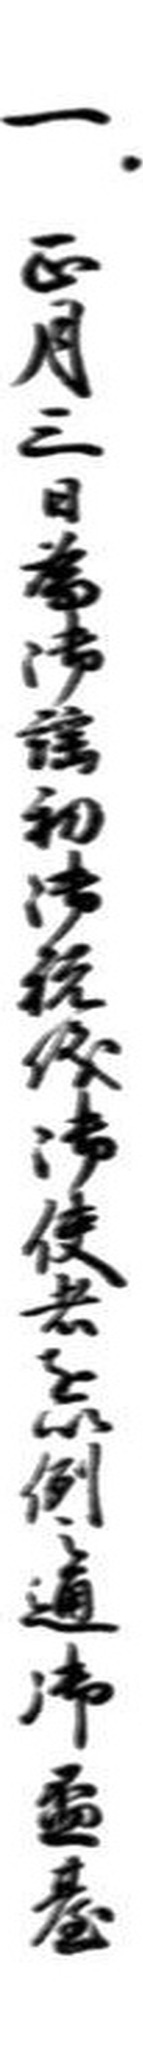一正月三日為御謡初御祝儀御使者を以例之通御盃台

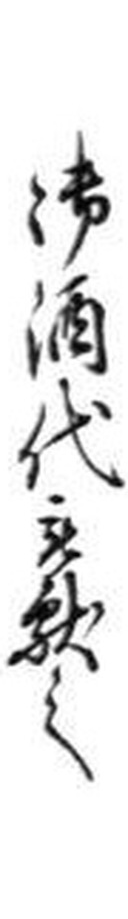御酒代被献之
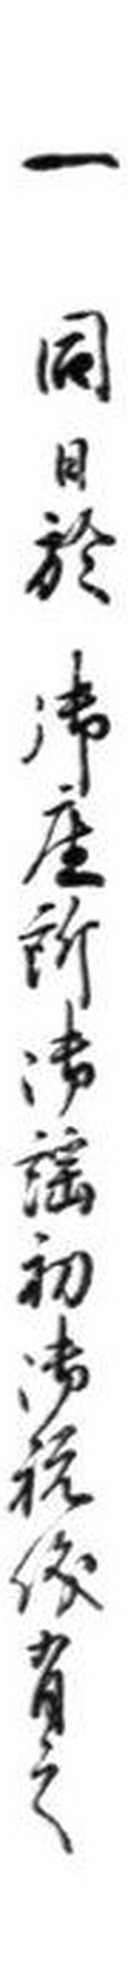一同日於御座所御謡初御祝儀有之
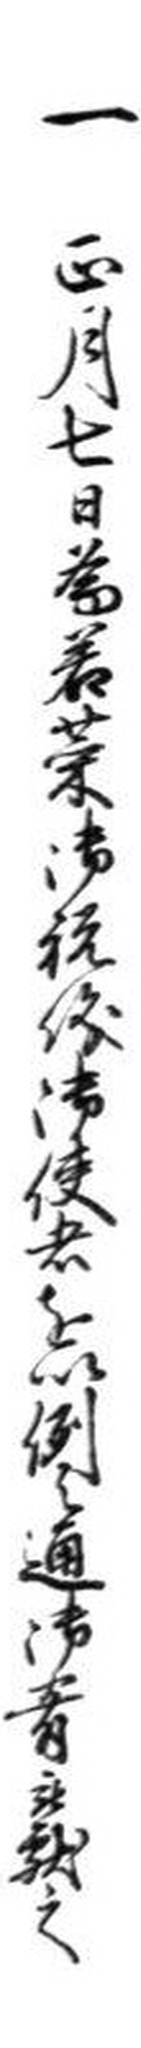一正月七日為若菜御祝儀御使者を以例之通御肴被献之
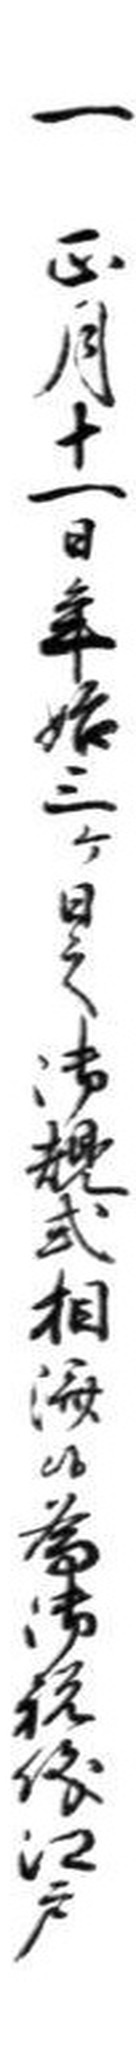一正月十一日年始三ヶ日之御規式相済候為御祝儀江戸
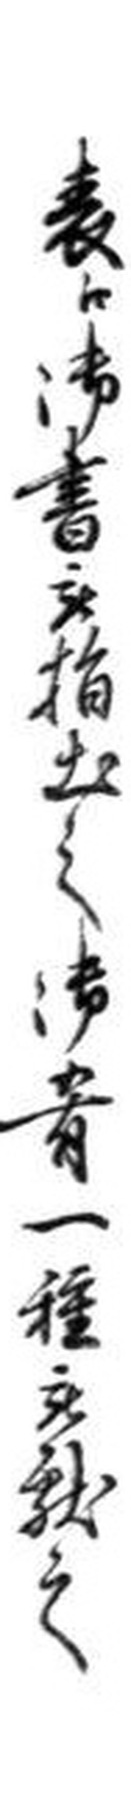表江御書被指出之御肴一種被献之
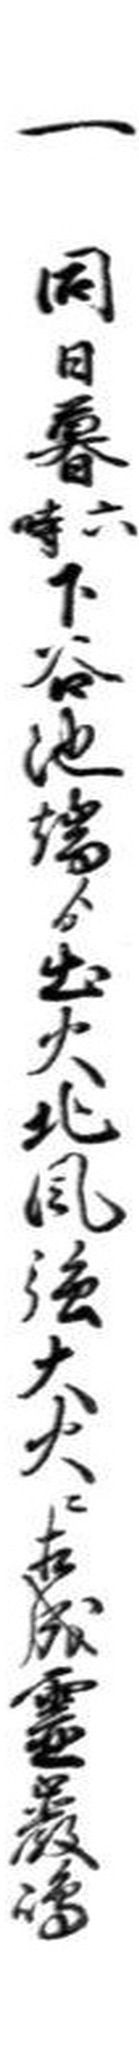一同日暮六時下谷池端ゟ出火北風強大火ニ相成霊巌嶋
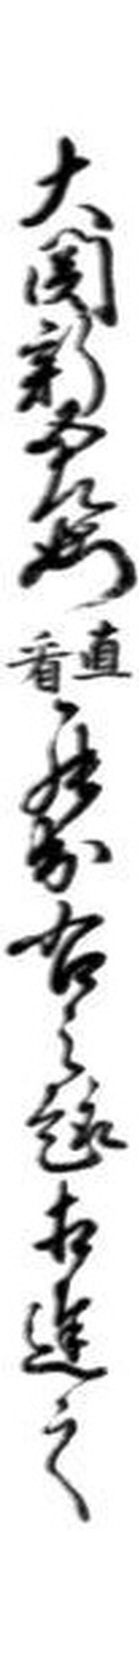大関新五左衛門直看罷出右之趣相達之
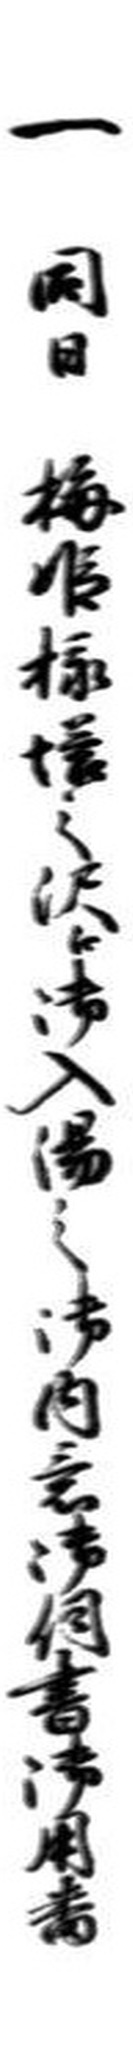一同日梅姫様塔之沢江御入湯之御内意御伺書御用番
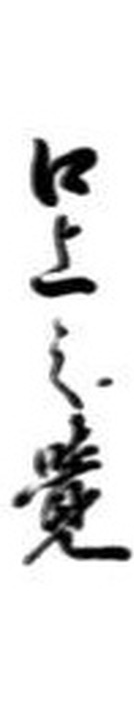口上之覚
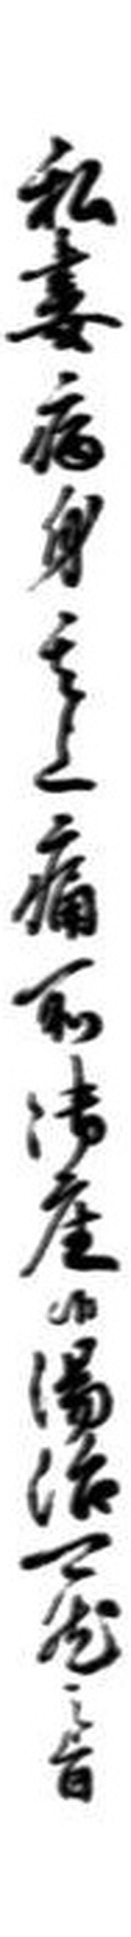私妻病身其上痛所御座候湯治可然之旨
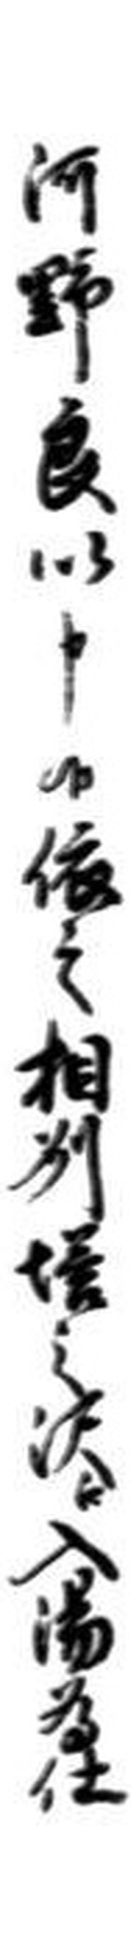河野良以申候依之相州塔之沢江入湯為仕
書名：家譜 三十一 吉邦公 享保元年
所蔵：福井県文書館 Fukui Prefectural Archives
